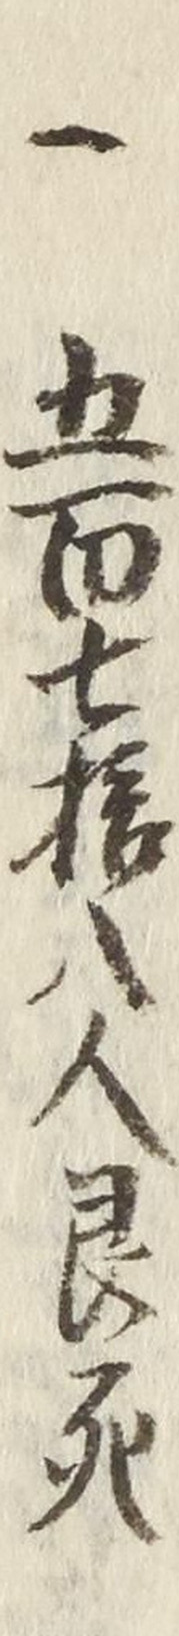一五百七拾八人即死
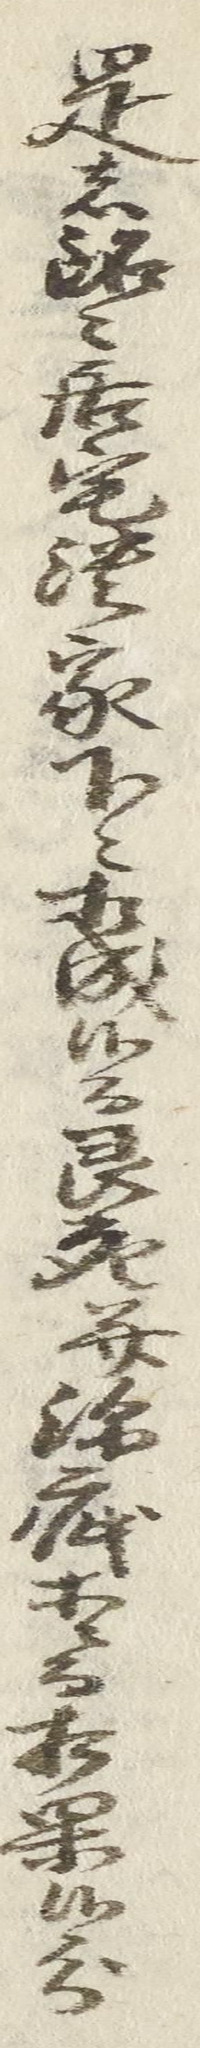是は銘々居宅潰家下ニ相成候而即死并深疵等ニ而相果候分
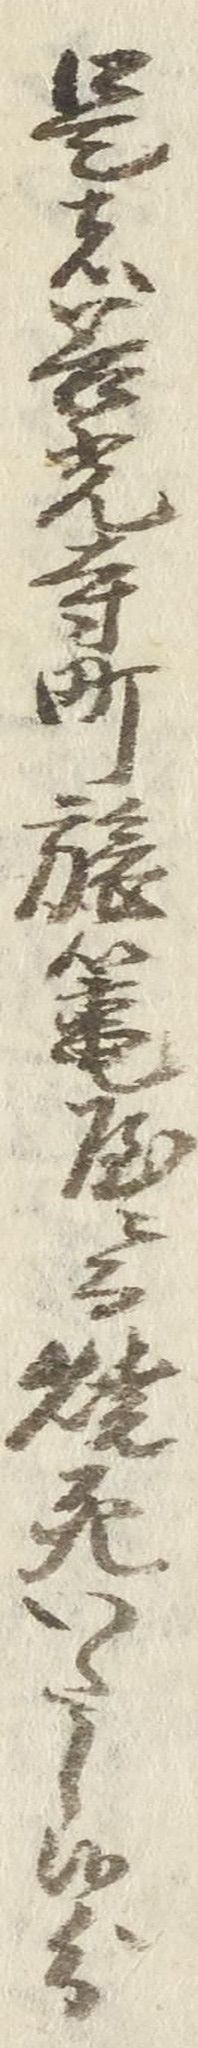是は善光寺町旅籠屋ニ而焼死いたし候分
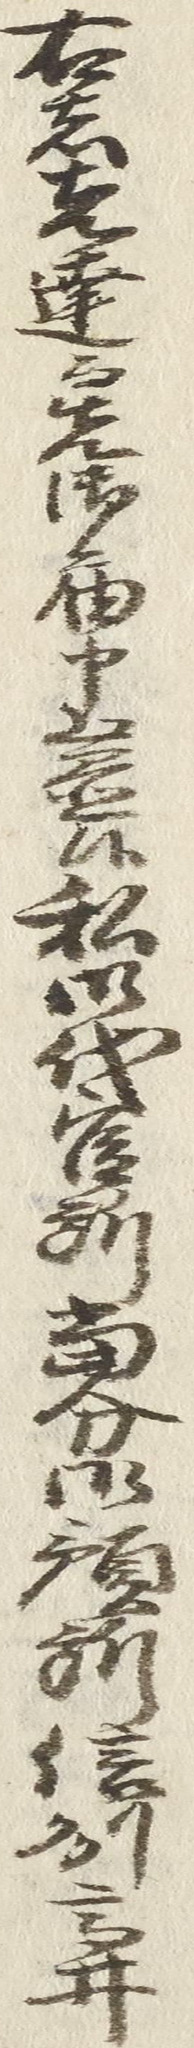右は先達而先御届申上置候私御代官所当分御預所信州高井
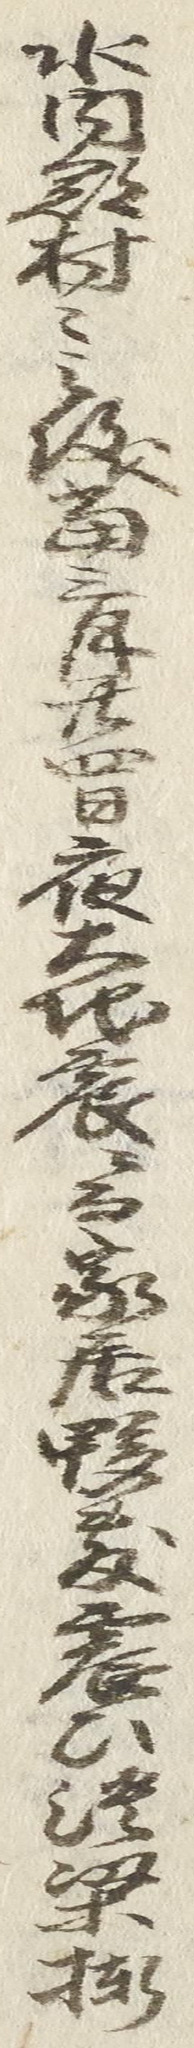水内郡村々之儀当三月廿四日夜大地震ニ而家居夥敷震ひ潰梁桁
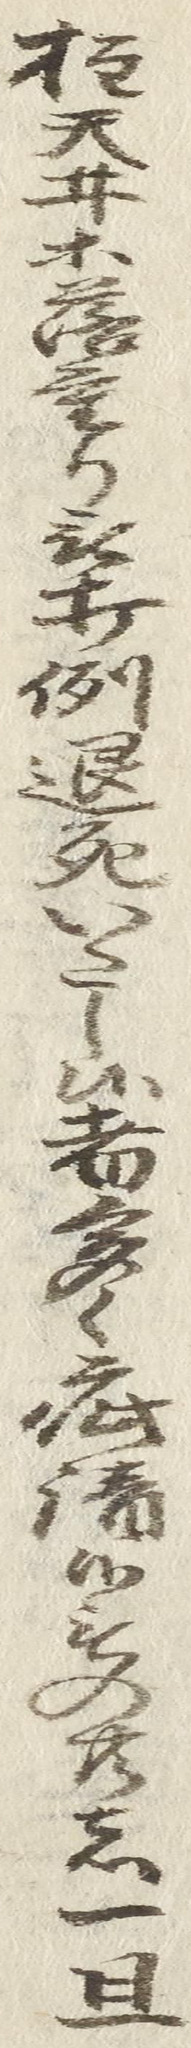柱天井等落重り被打倒退死いたし候者多く疵請候もの共は一旦
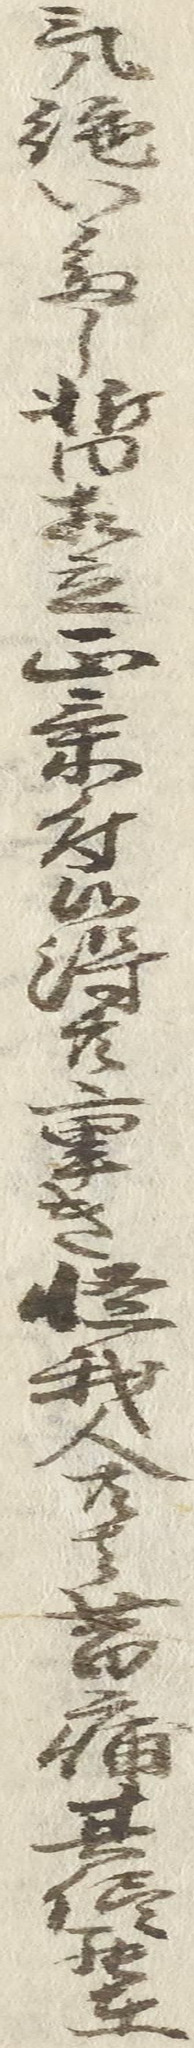気絶いたし暫相立正気付候得共重き怪我人共は苦痛其侭罷在
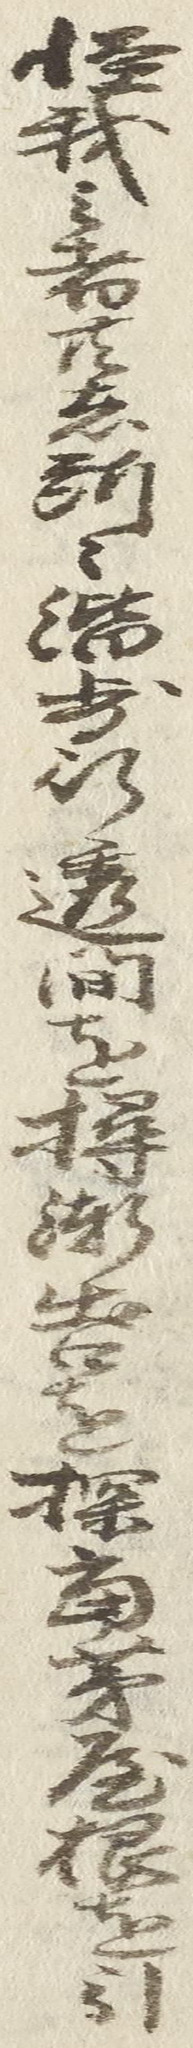怪我之者共は所々湝歩行透間を撏漸出口を探当茅屋根を引
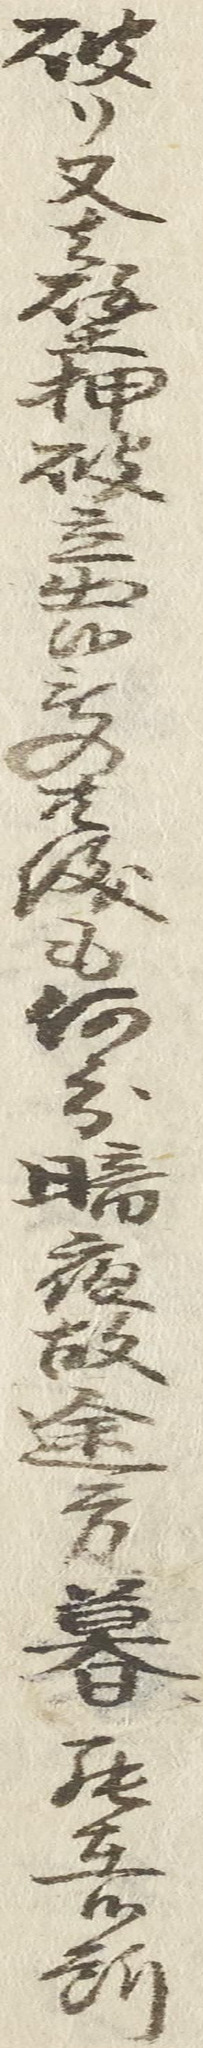破り又は壁押破立出候もの共儀も何分暗夜故途方暮罷在候所
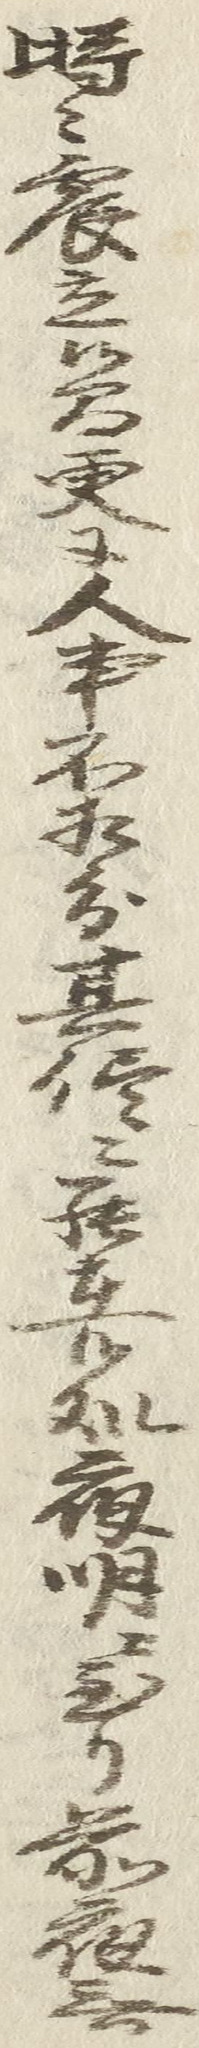時々震立候間更に人事不相分其侭ニ罷在候処夜明ニ至り前夜無
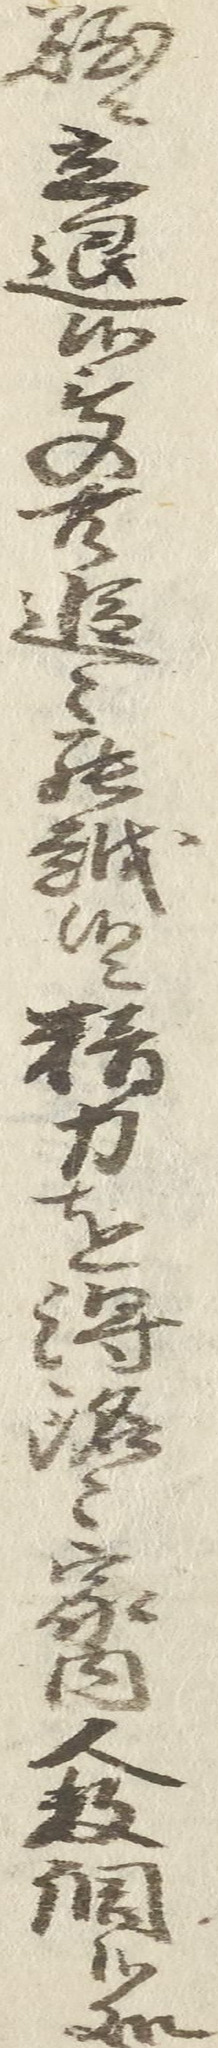難ニ立退候もの共追々罷越候ニ精力を得路々家内人数調候処
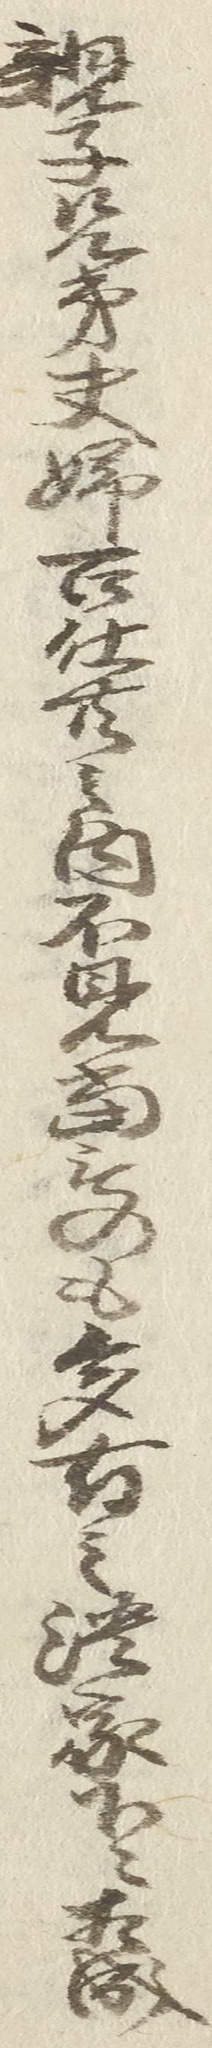親子兄弟夫婦召仕共之内不見当ものも多有之潰家下々相成
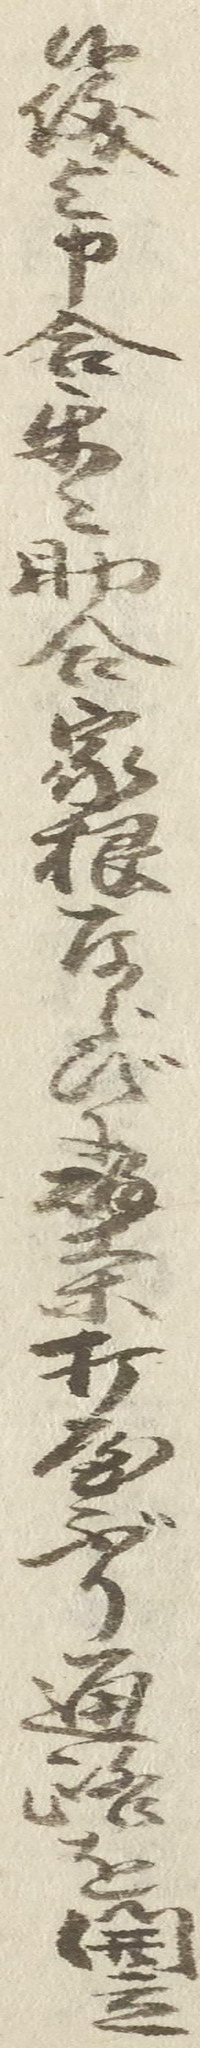候儀与申合互ニ助合家根ならびに壁等打やぶり通路を開立

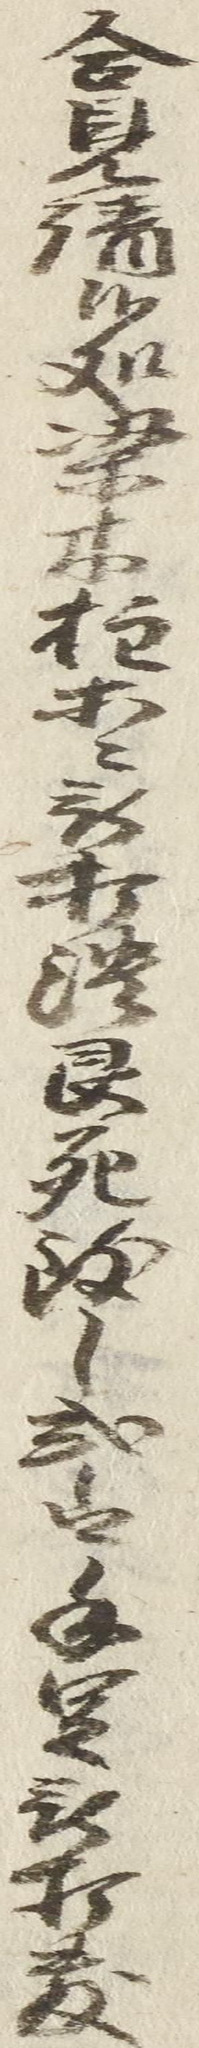合見請候処梁木柱等ニ被打潰即死致し或は手足被打敷
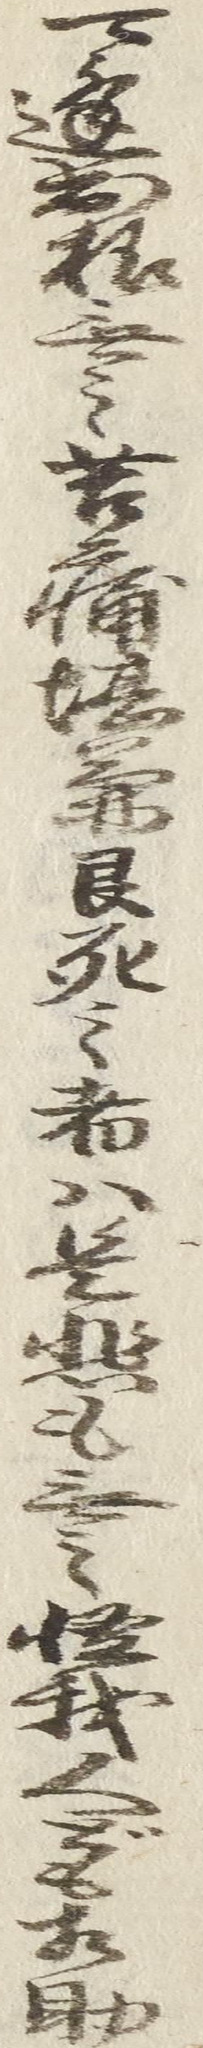可逢出様無之苦痛堪兼即死之者は是悲も無之怪我人ども相助
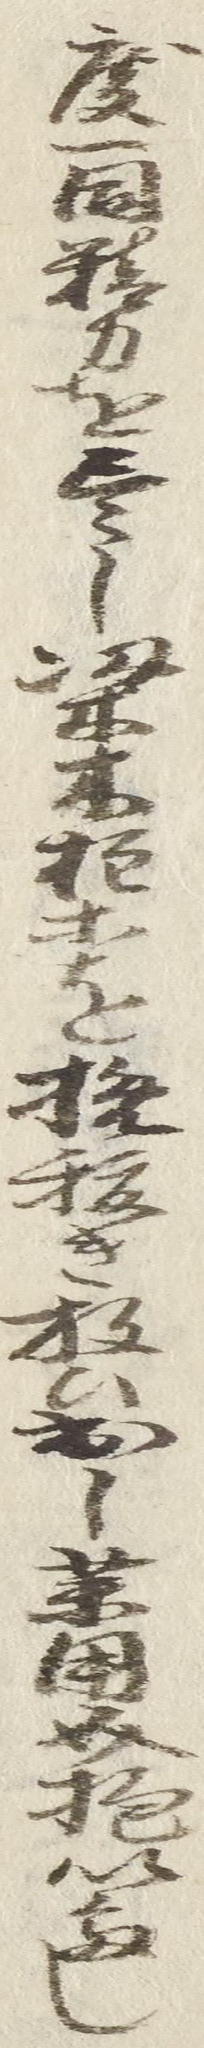度一同精力を尽し梁木柱等を挽抜い救ひ出し薬用介抱いたし
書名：従往古地震御届書記誌之一
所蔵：東京大学地震研究所図書室 Earthquake Research Institute Library, The University of Tokyo, JAPAN
